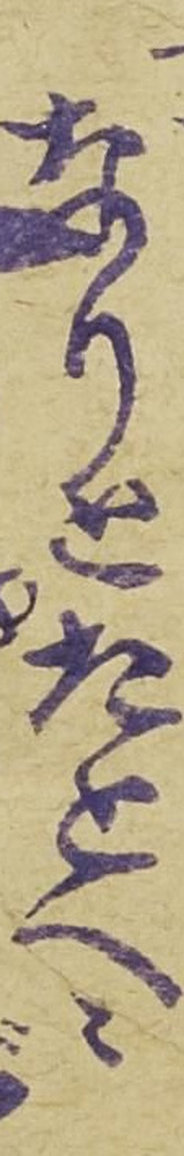なりとたとへに
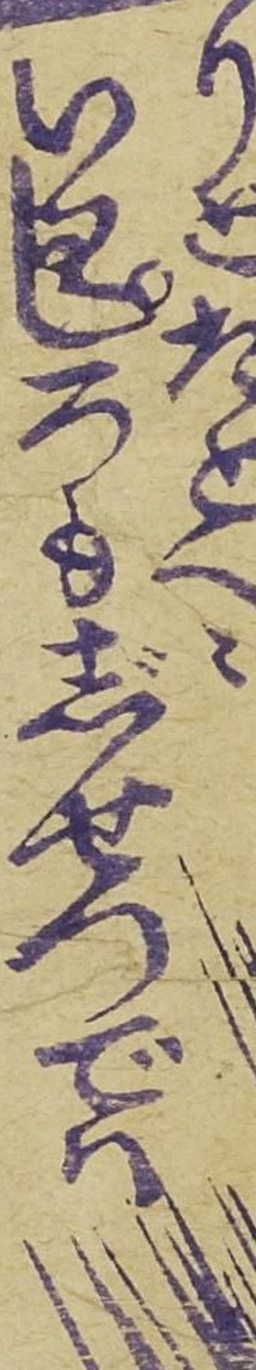いわしろもじせつでは
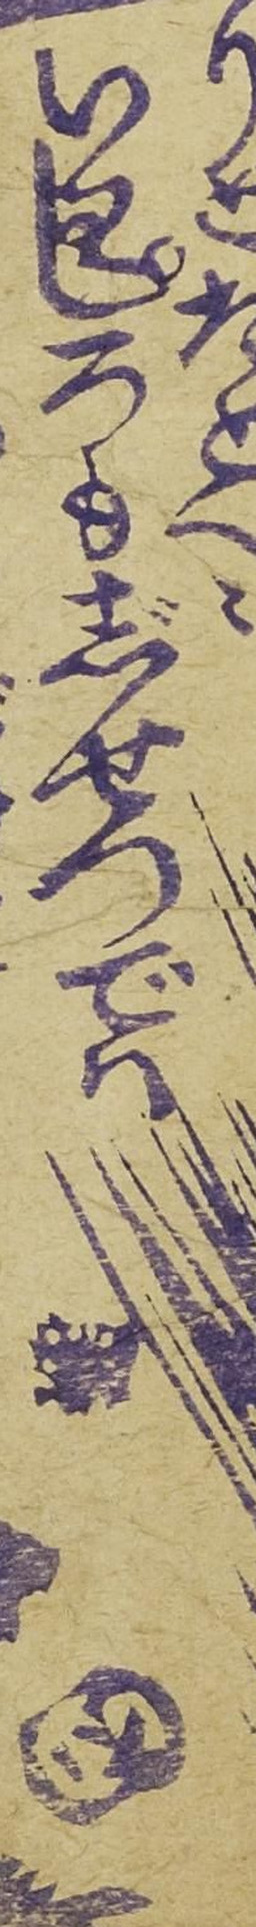いわしろもじせつでは
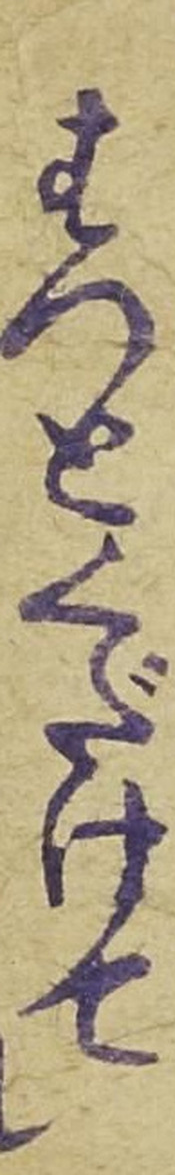はつとくだけて
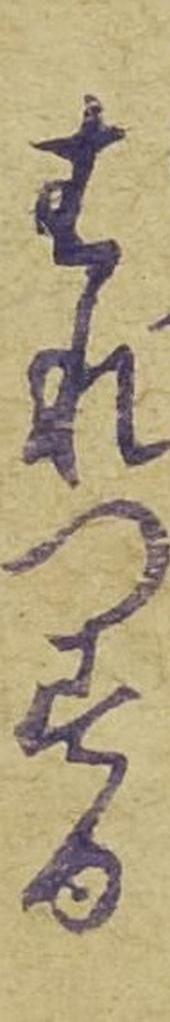はれつする

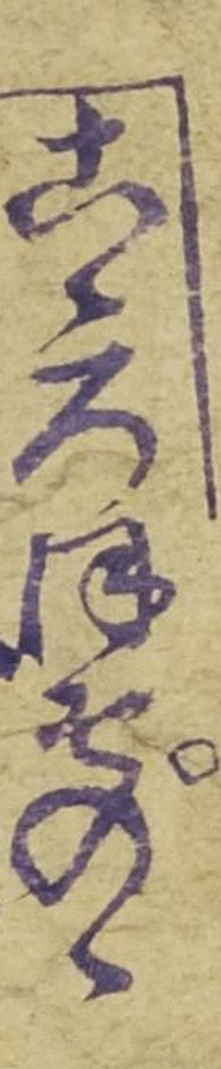〽こゝろほそのゝ
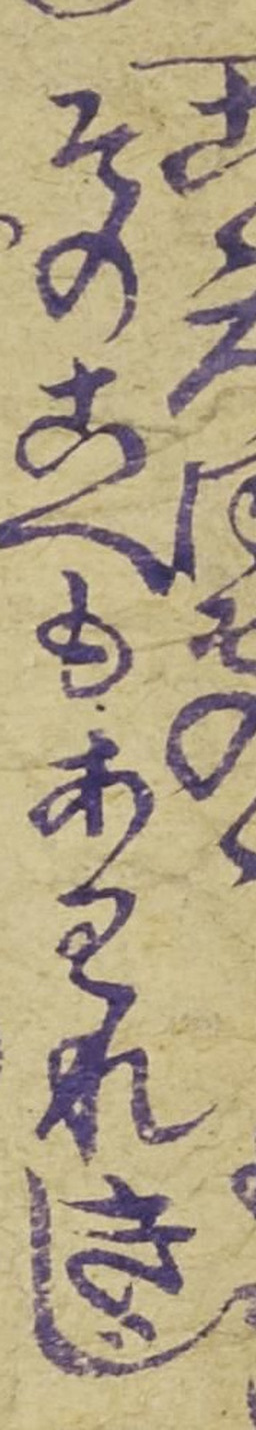そのこへもあわれきし
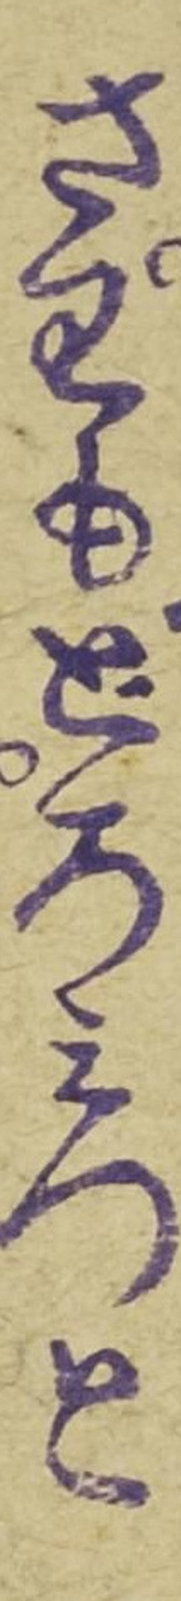さわもどろみつと
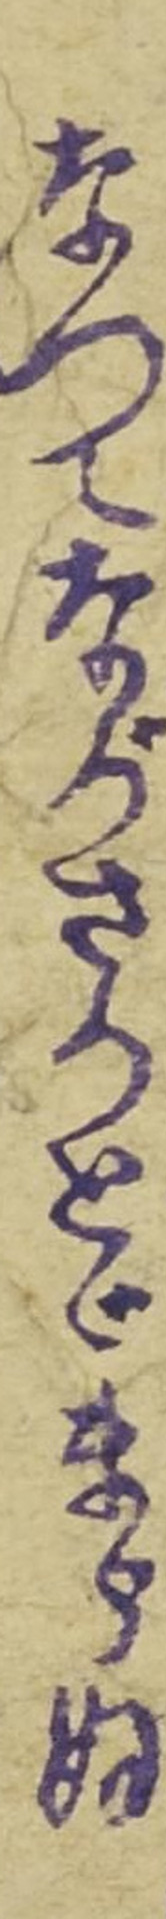なつてながさかとゞまらぬ
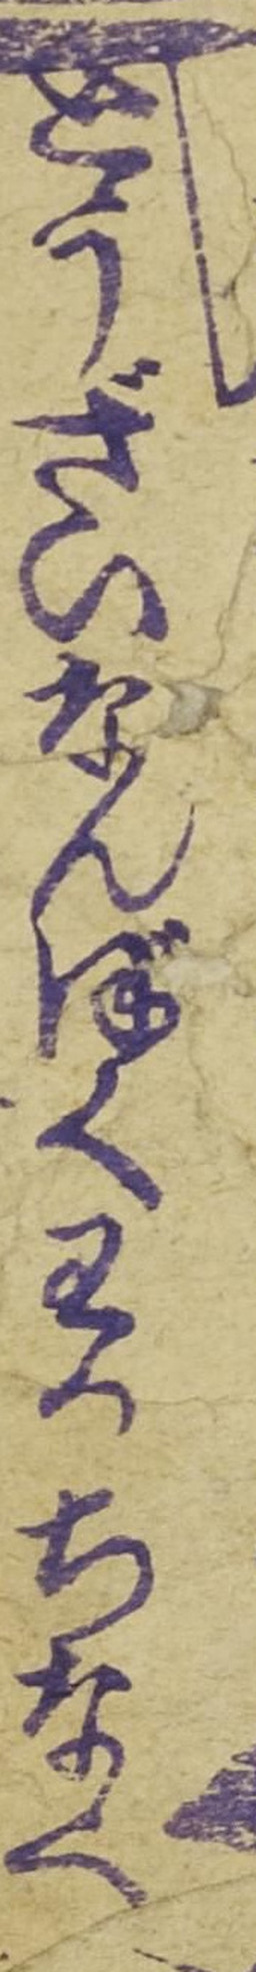〽とうざいなんぼくりくちなく
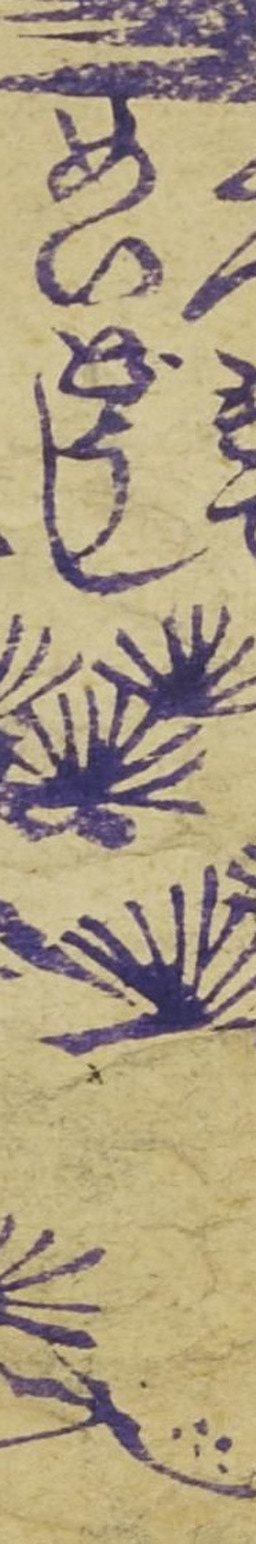めいどうし
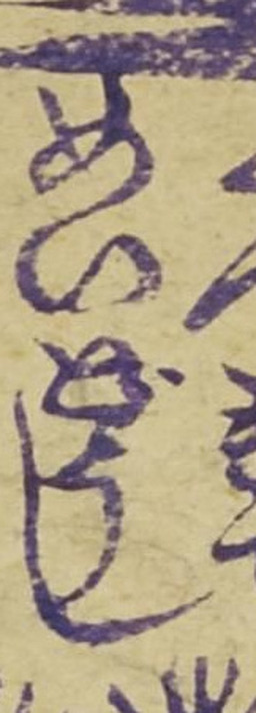めいどうし
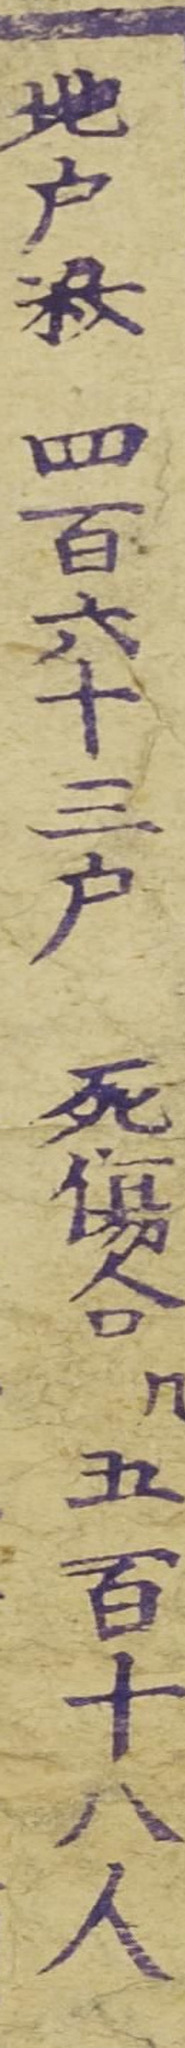地戸数四百六十三戸死傷人口凡五百十八人
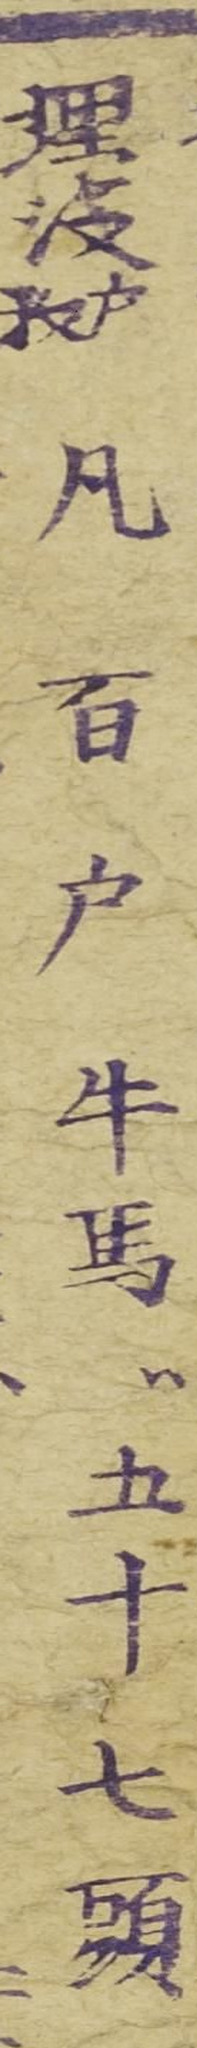埋没戸数凡百戸牛馬は五十七頭
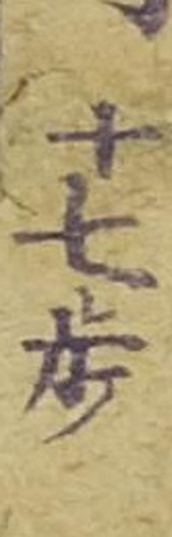十七歩
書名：福嶋縣岩代国　ばんだいさん一ツトセぶし
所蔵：東京大学地震研究所図書室 Earthquake Research Institute Library, The University of Tokyo, JAPAN
